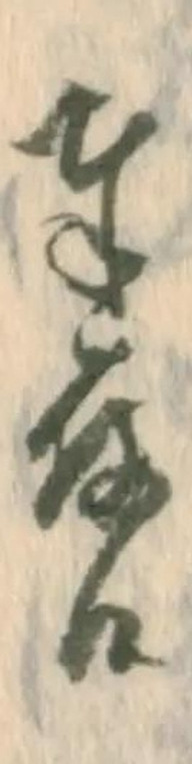奉存候
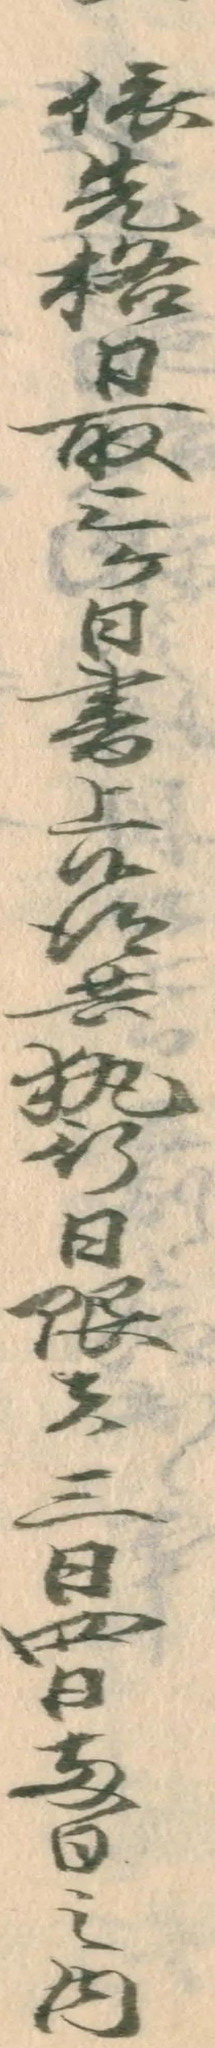一依先格日取三ケ日書上候得共執行日限は三日四日両日之内
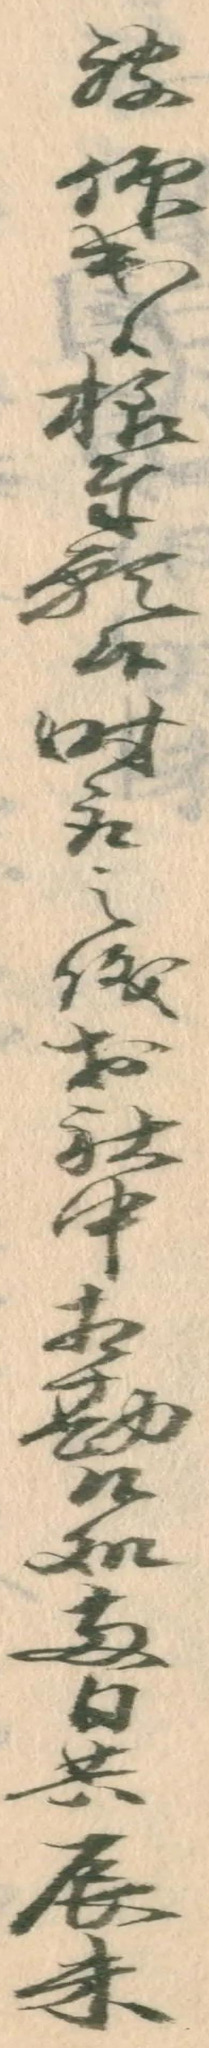被仰出候様奉願候時取之儀於社中相勘候処両日共辰未
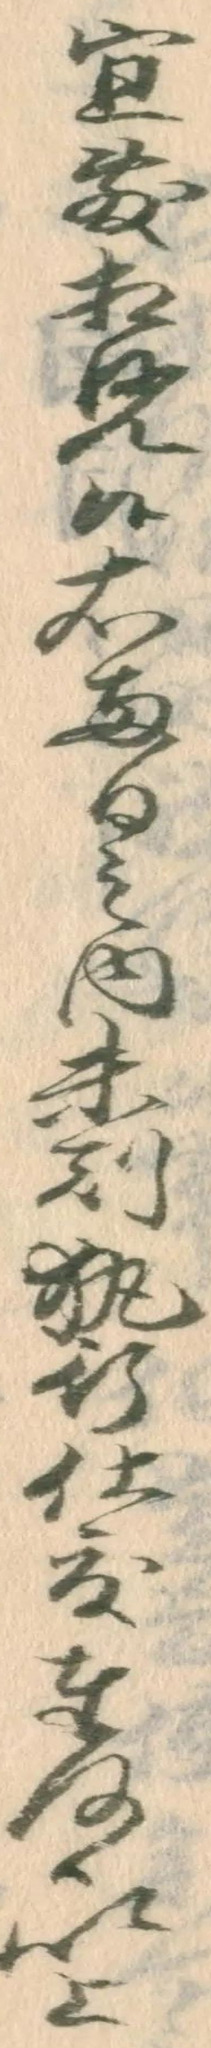宜敷相見候右両日之内未刻執行仕度奉存候以上
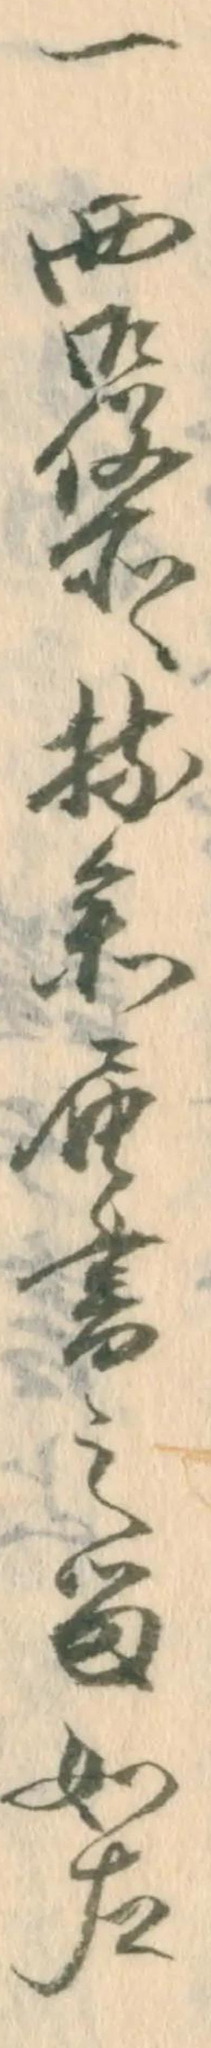一西御役所へ持参届書之留如左

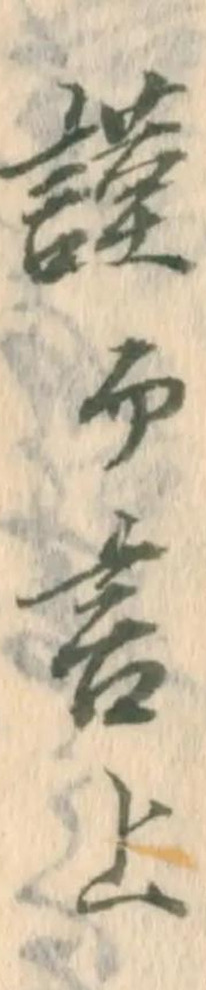謹而言上
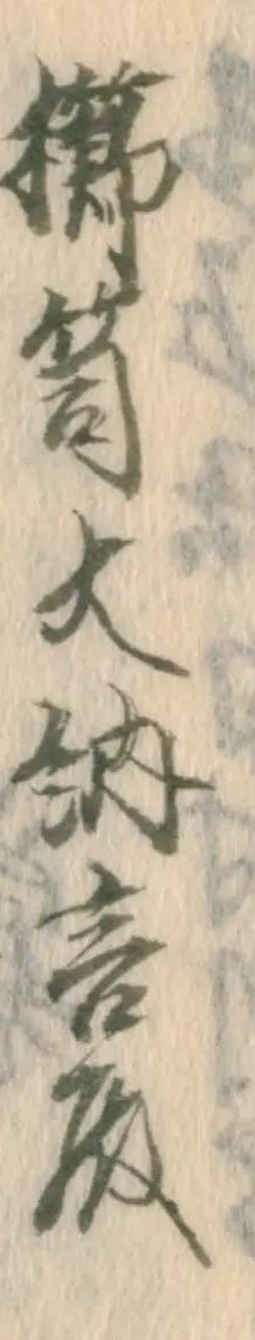櫛笥大納言殿
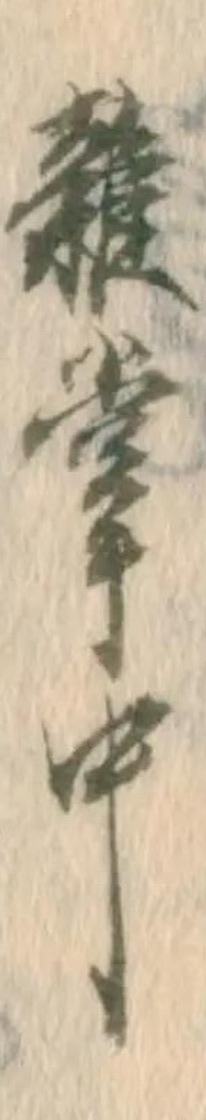雑掌中
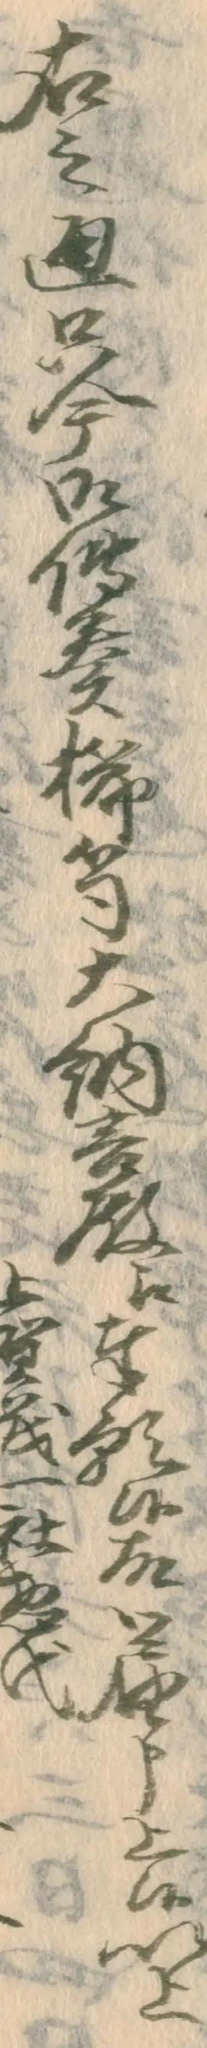右之通只今御伝奏櫛笥大納言殿江奉願候故御届申上候以上
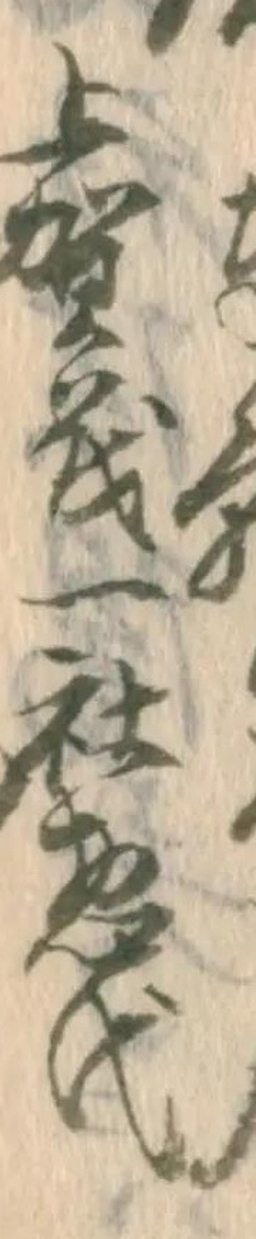上賀茂一社惣代
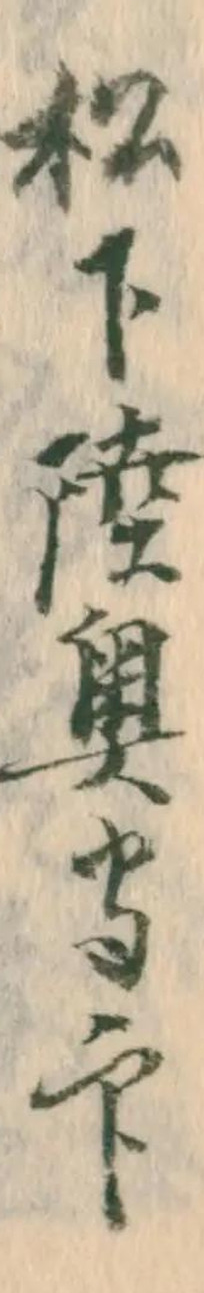松下陸奥守印
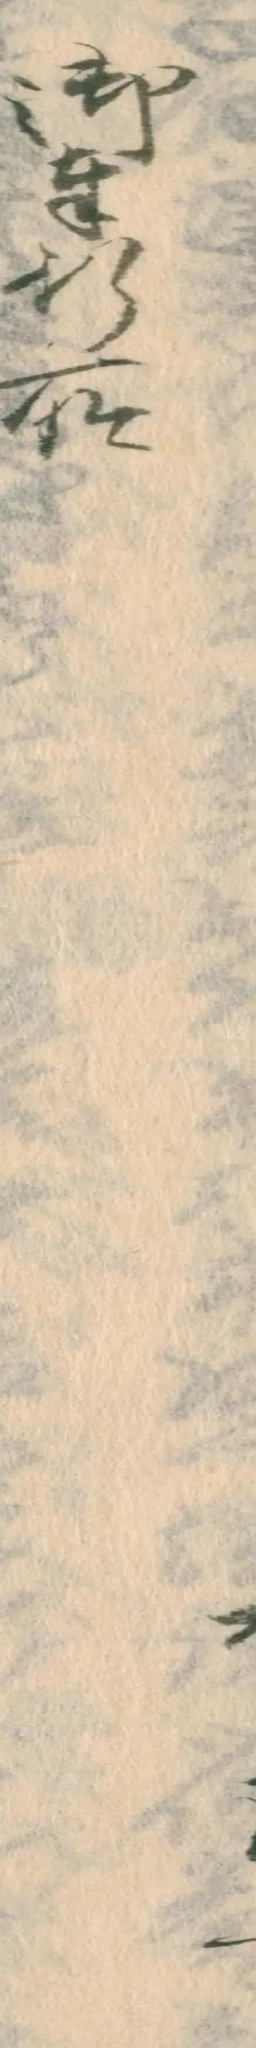御奉行所
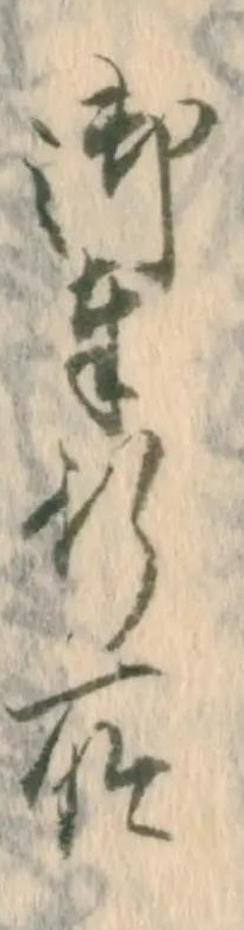御奉行所
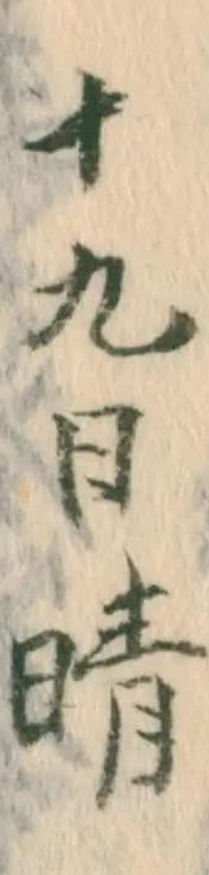十九日晴
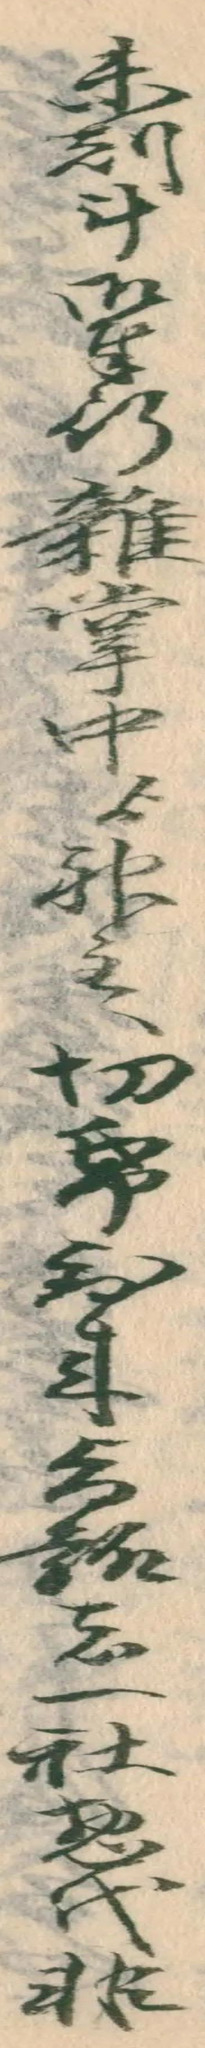一未刻計御奉行雑掌中ゟ神主へ切帋到来旨趣は一社惣代非
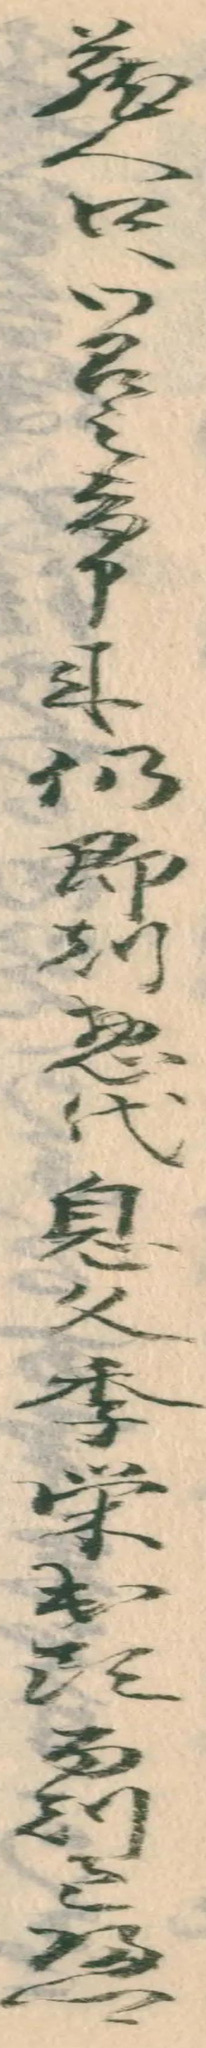蔵人口へ御召之旨申来仍即刻惣代息久季栄出頭酉刻過帰郷
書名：賀茂社記録. 第17冊
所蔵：国立国会図書館 National Diet Library, JAPAN
